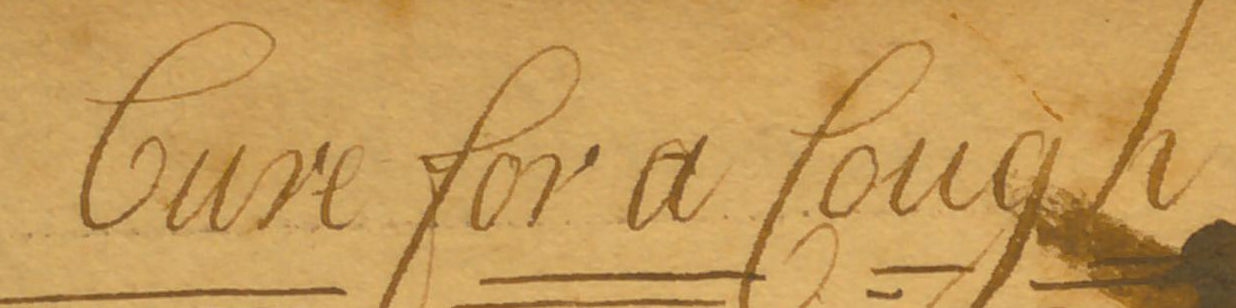Cure for a Cough
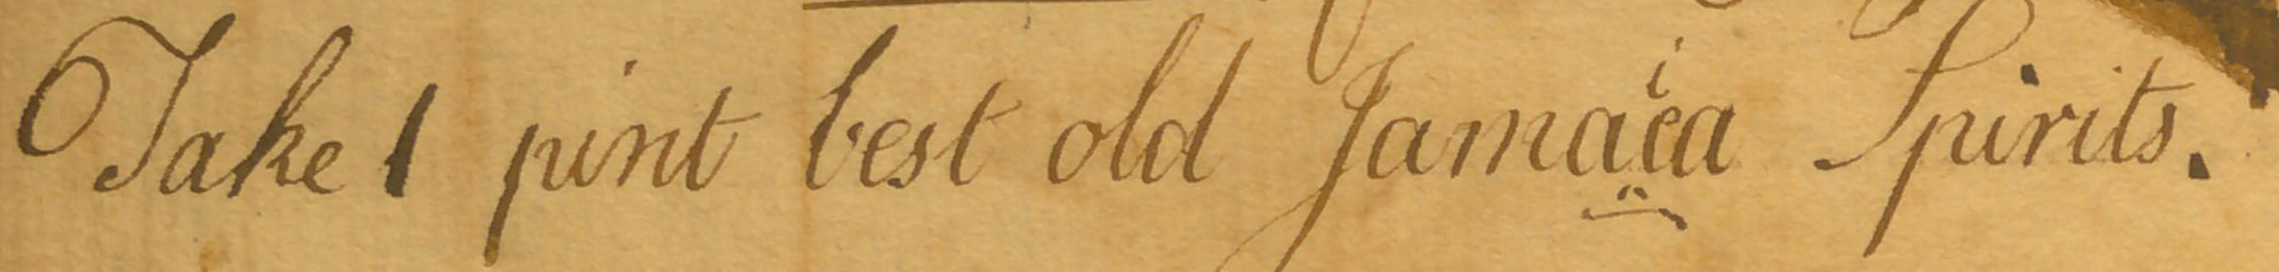Take 1 pint best old Jama^ica Spirits.
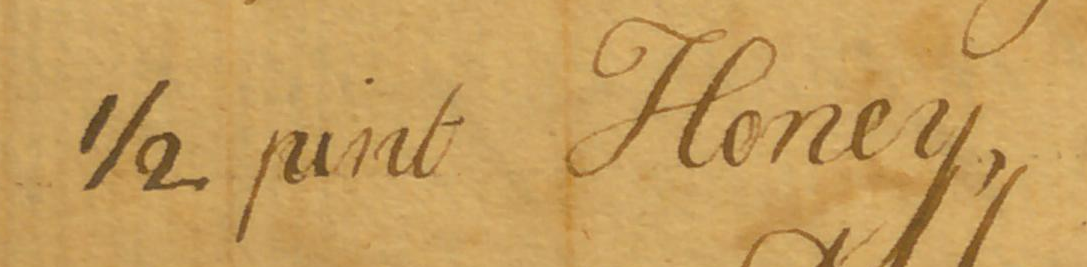1/2 pint Honey,
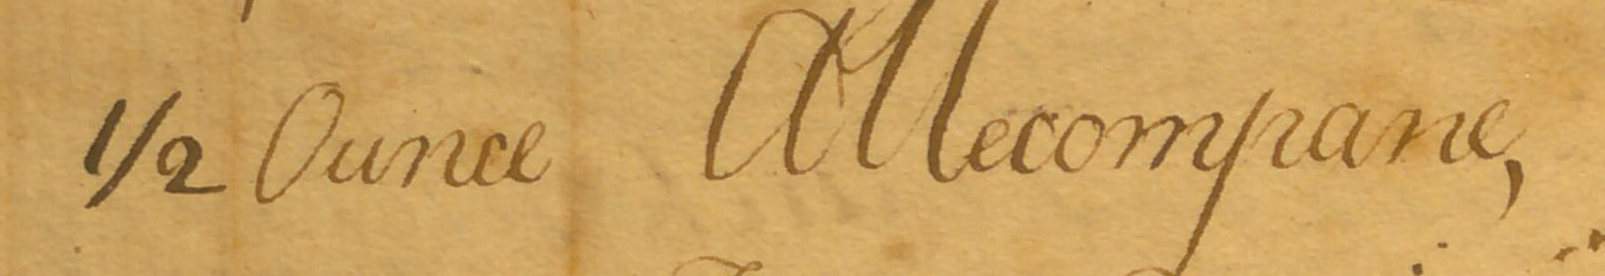1/2 Ounce Allecompane,
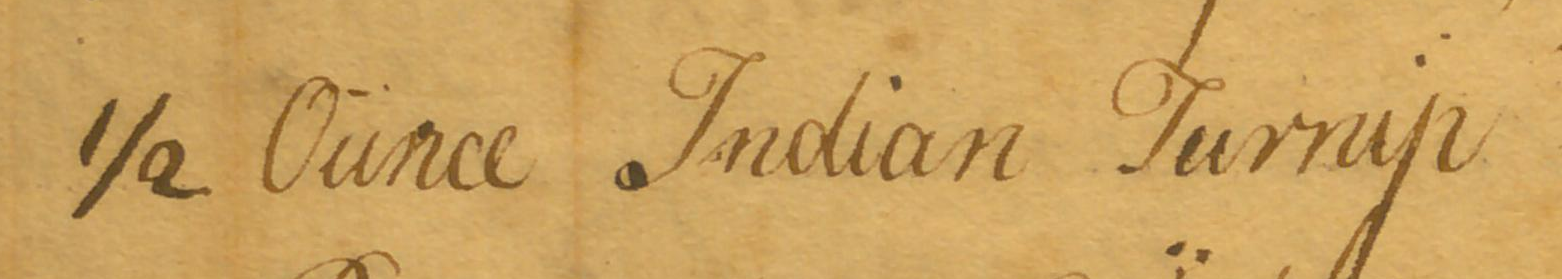1/2 Ounce Indian Turnip
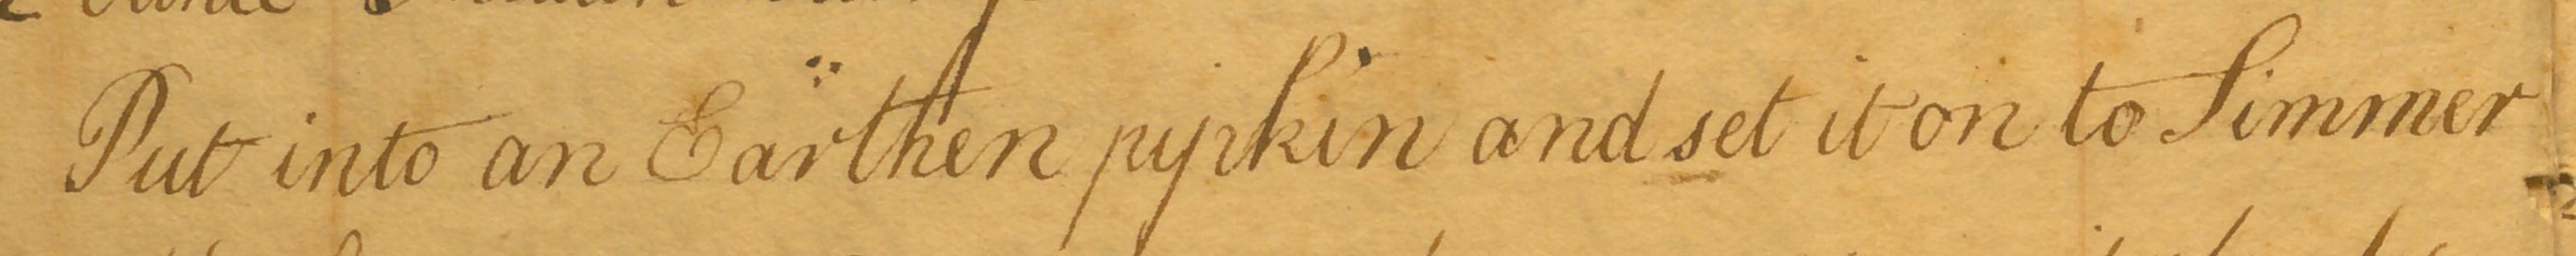Put into an Earthen pipkin and set it on to Simmer
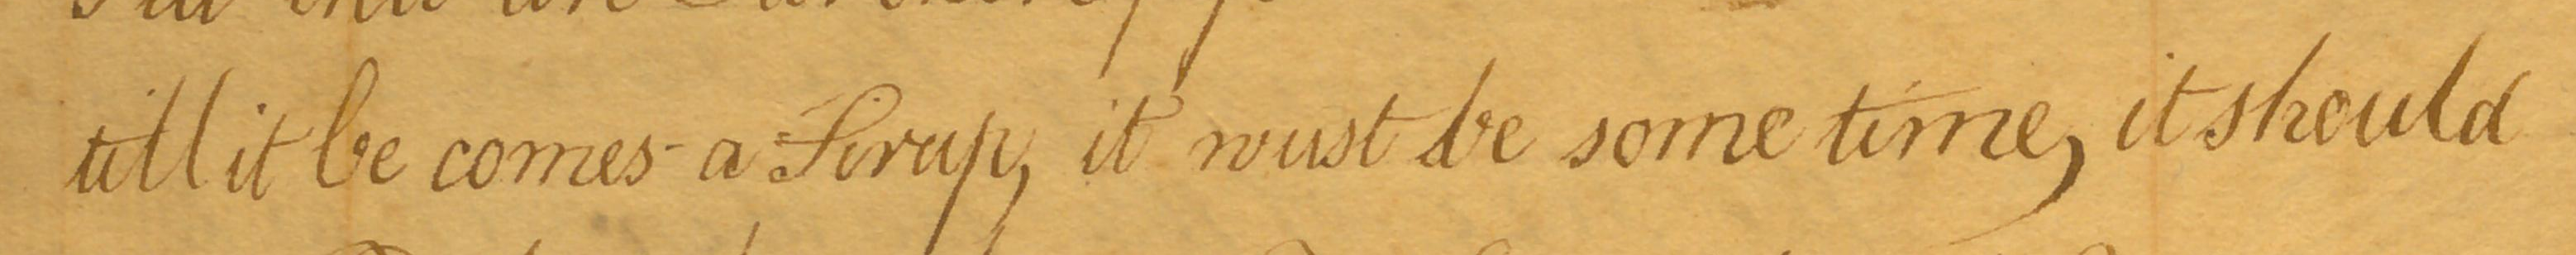till it be comes a sirup, it must be some time, it should
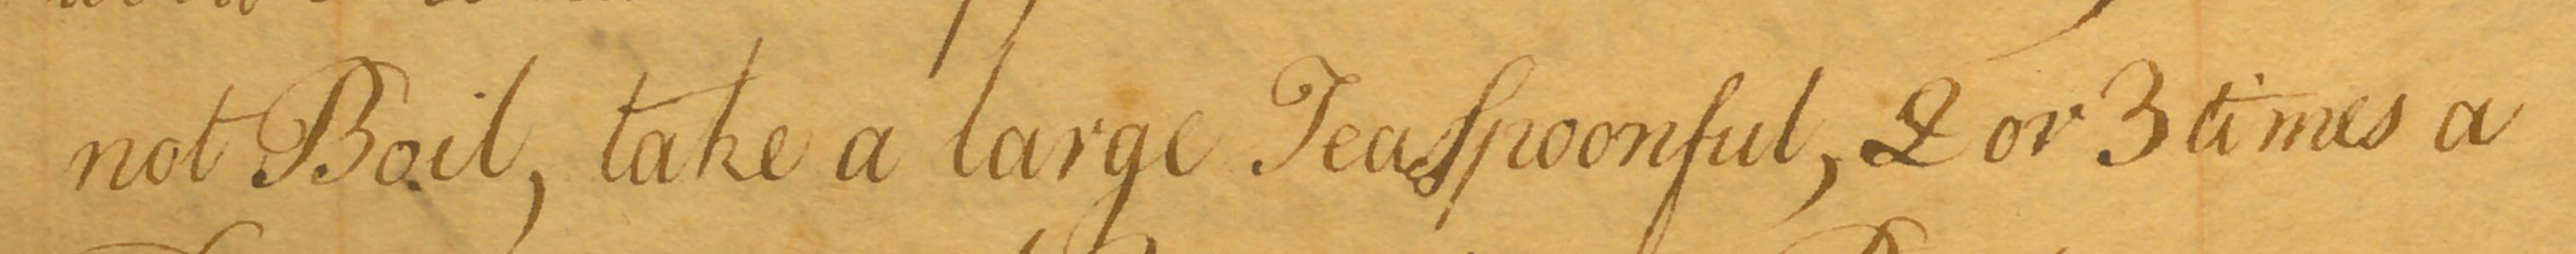not Boil, take a large Teaspoonful, 2 or 3 times a
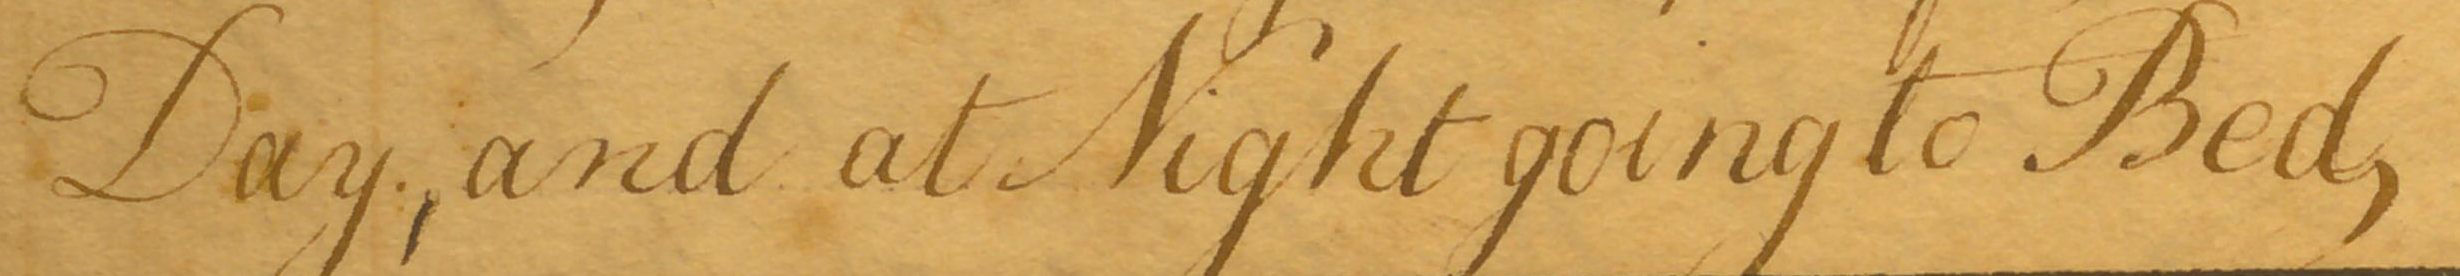Day; and at Night going to Bed,
